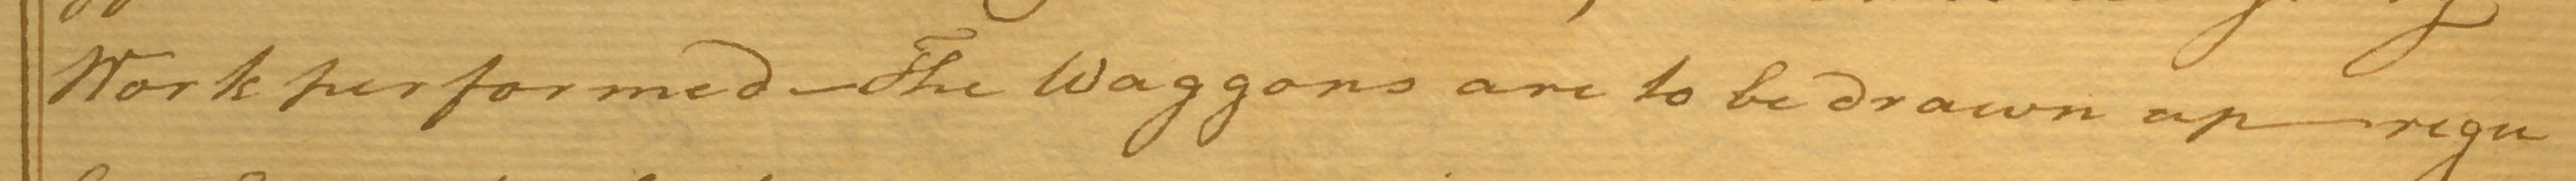Work performed- The Waggons are to be drawn up- regu
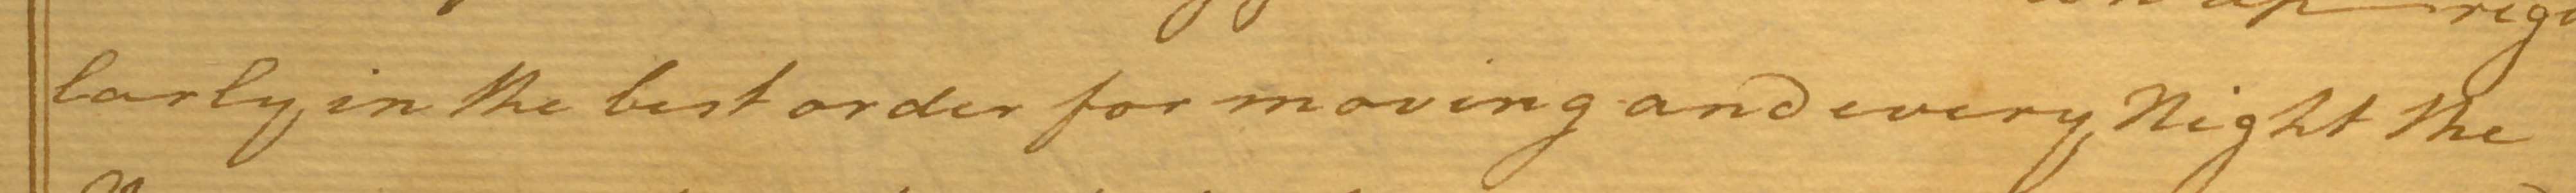larly in the best order for moving and every Night the
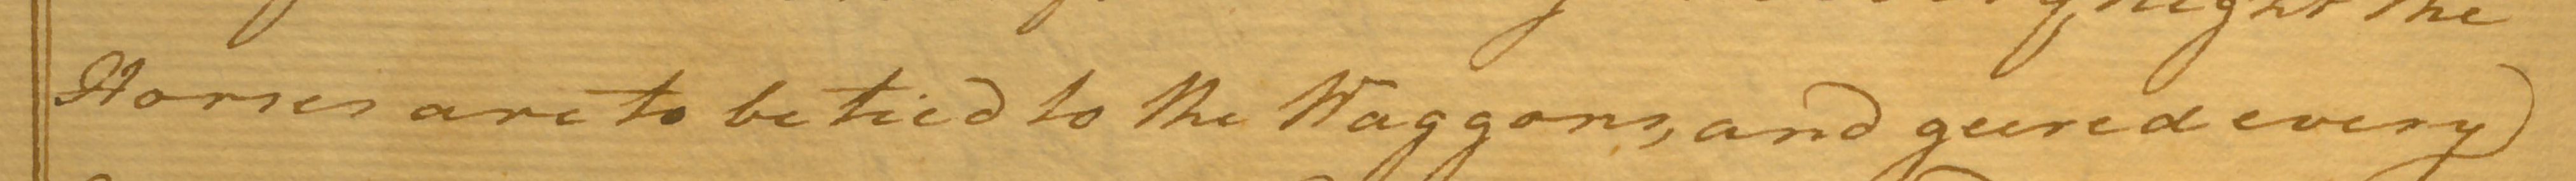Horses are to be tied to the Waggons, and geered every
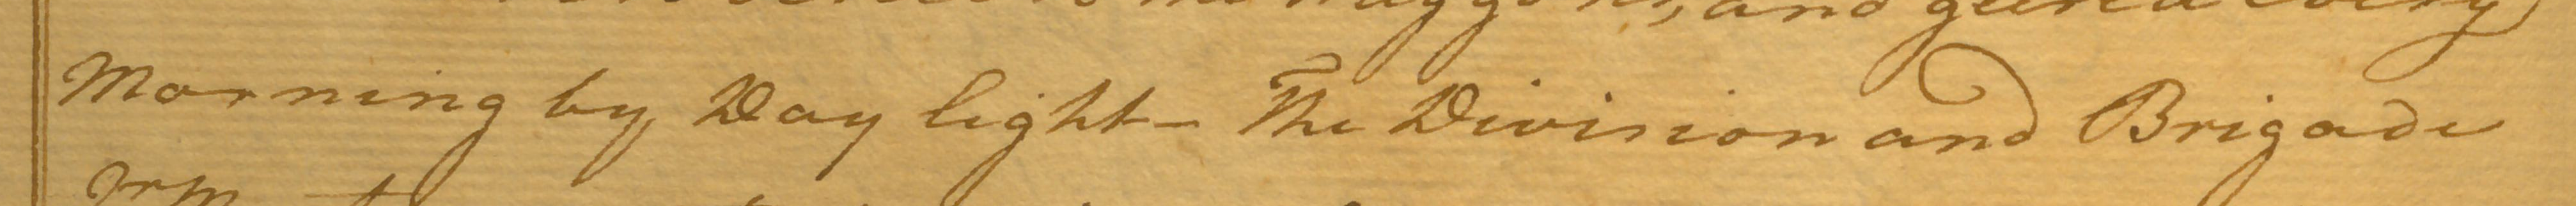Morning by Day light- The Division and Brigade
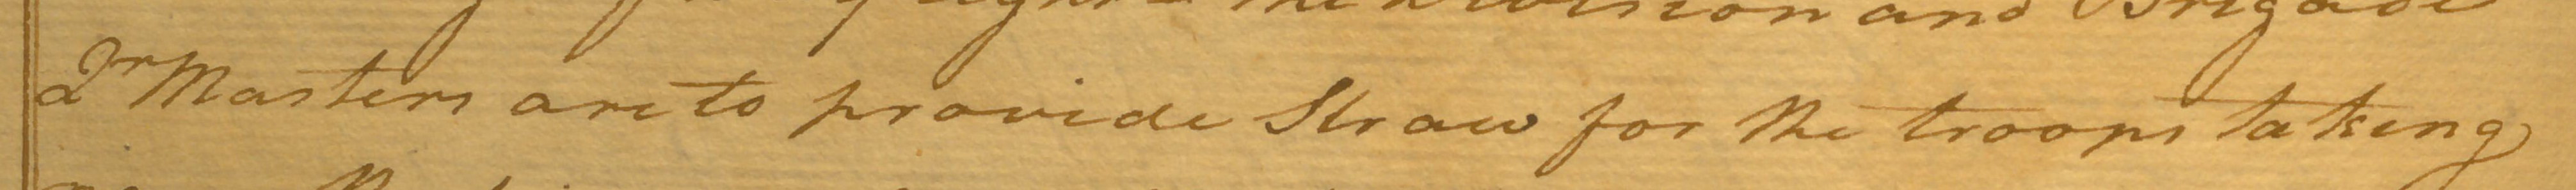Q^r Masters are to provide Straw for the troops taking
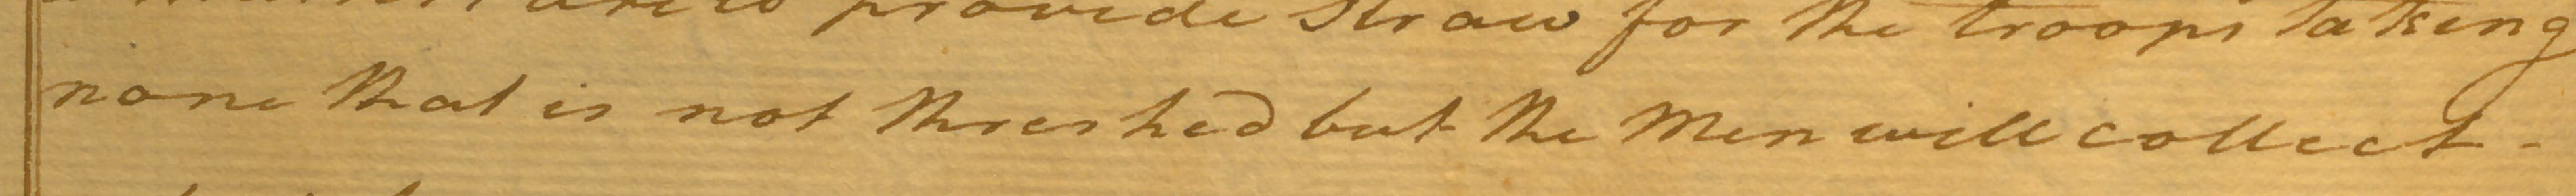none that is not threshed but the Men will collect
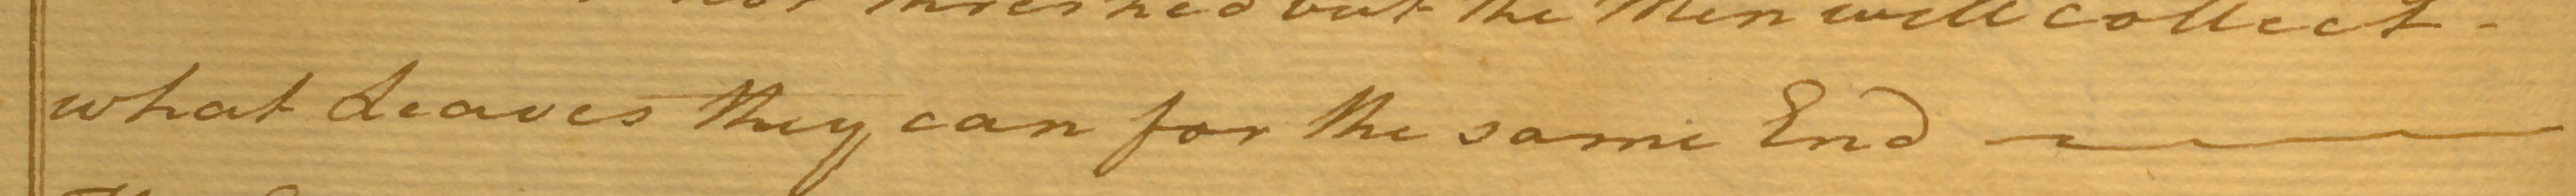what Leaves they can for the same End-
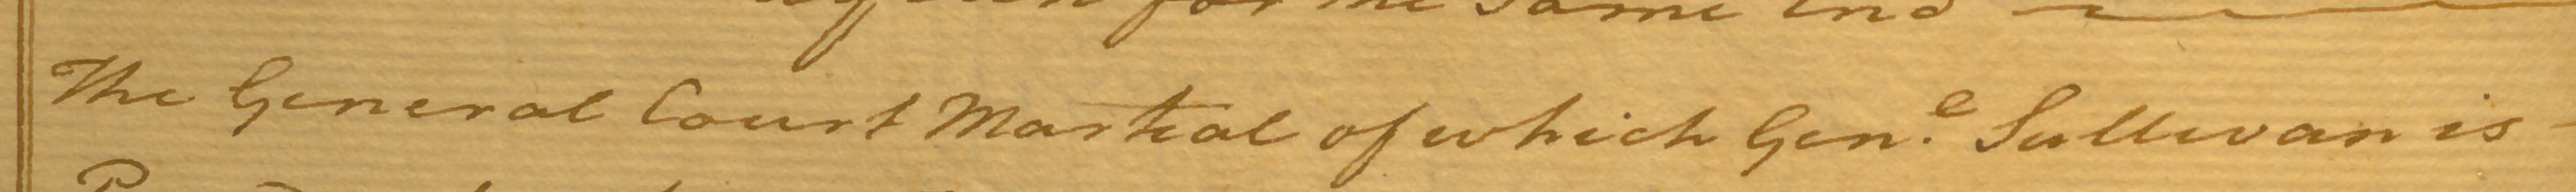The General Court Martial of which Gen^l. Sullivan is
